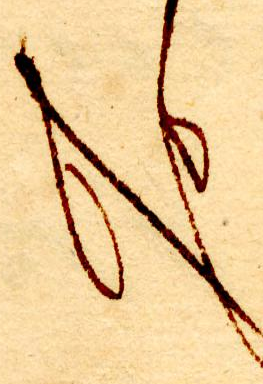To
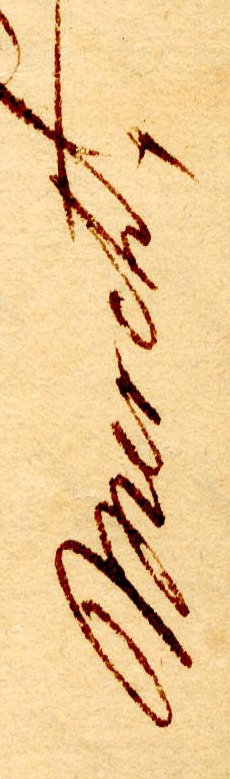Merch^t
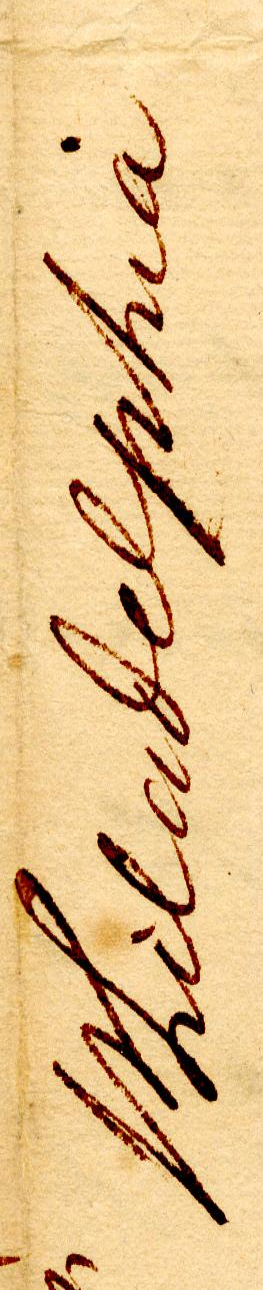Philadelphia
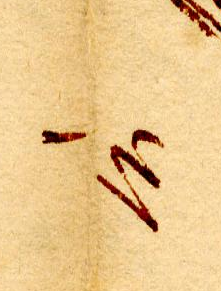In
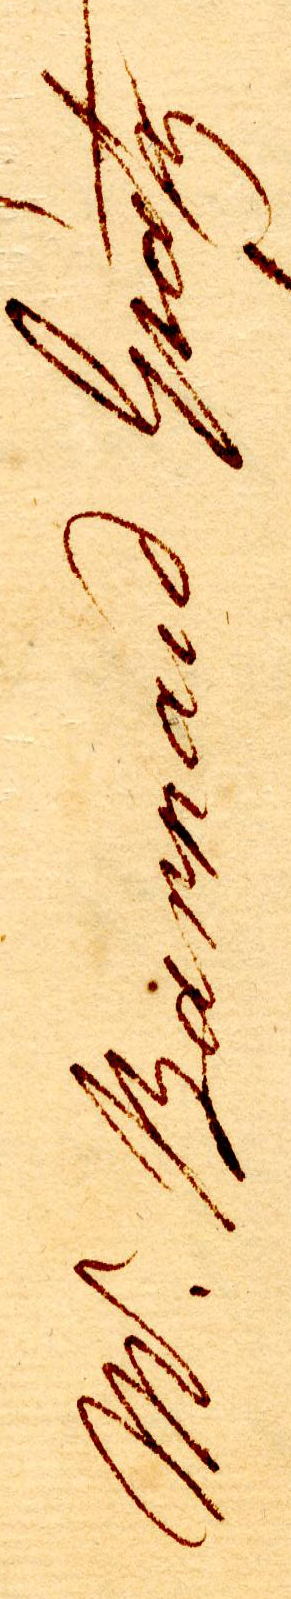M^r Barnard Gratz
